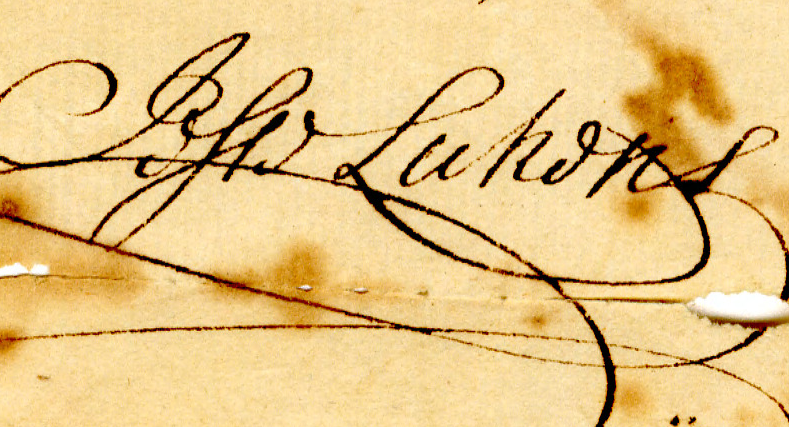John Lukens
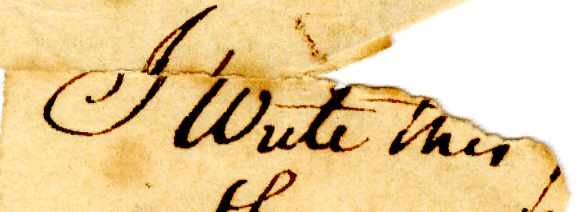I write this
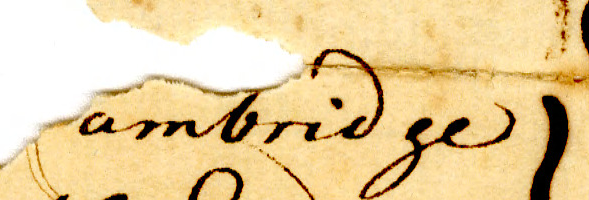ambridge
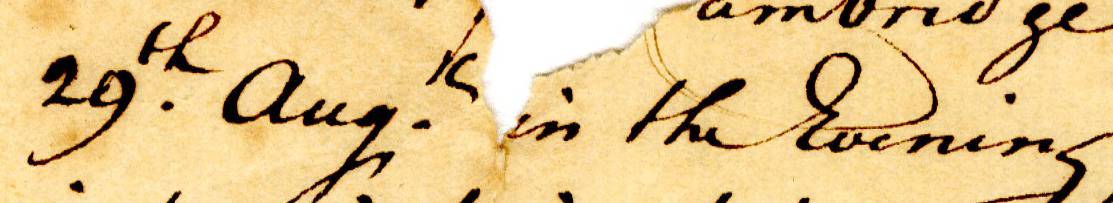29.^th Aug.^t in the Evening
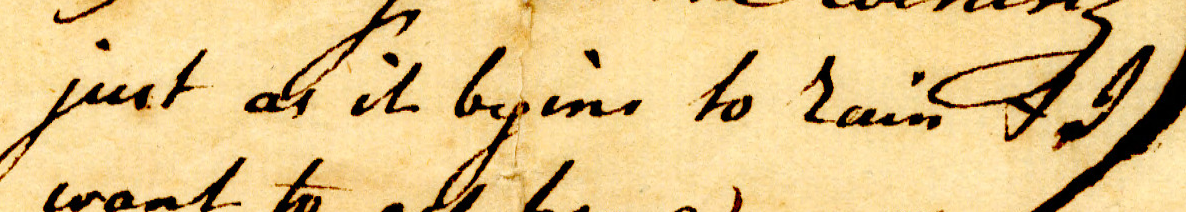just as it begins to rain & I
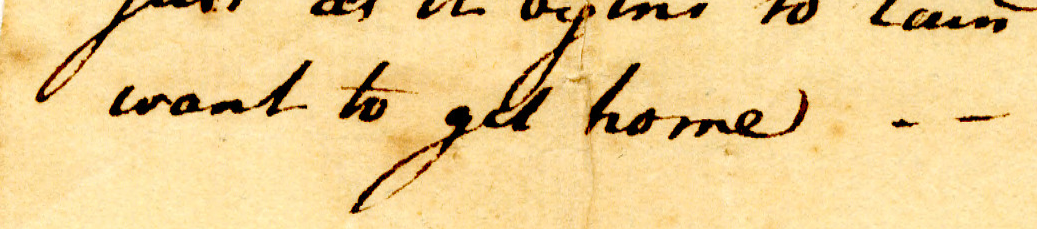want to get home--
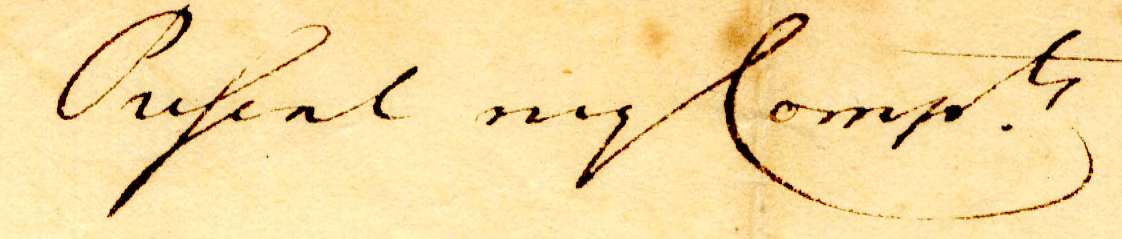Present my Comp.^ts
